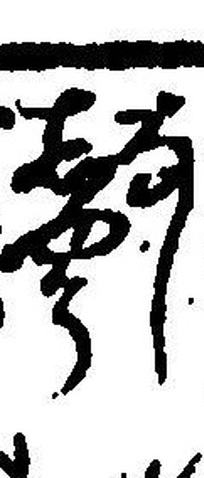しやう
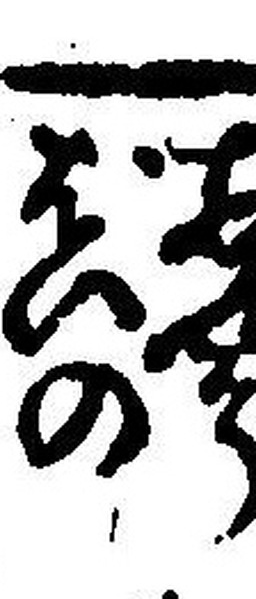ばいの
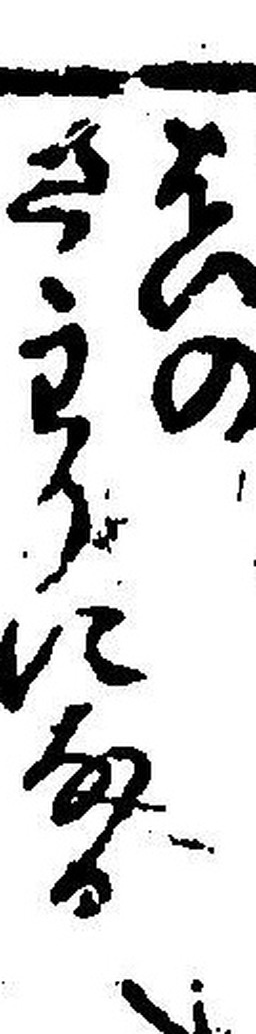す？わりになる
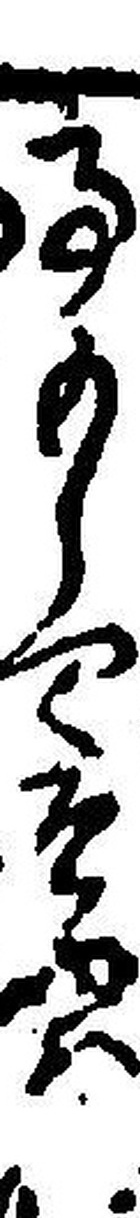事もしやそふは
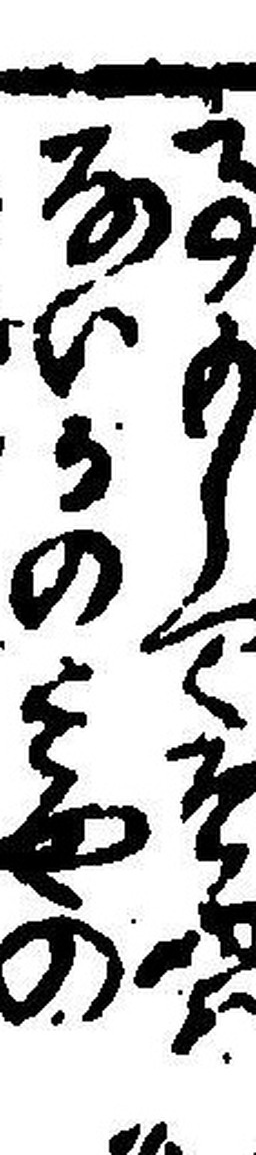ないかのみやの
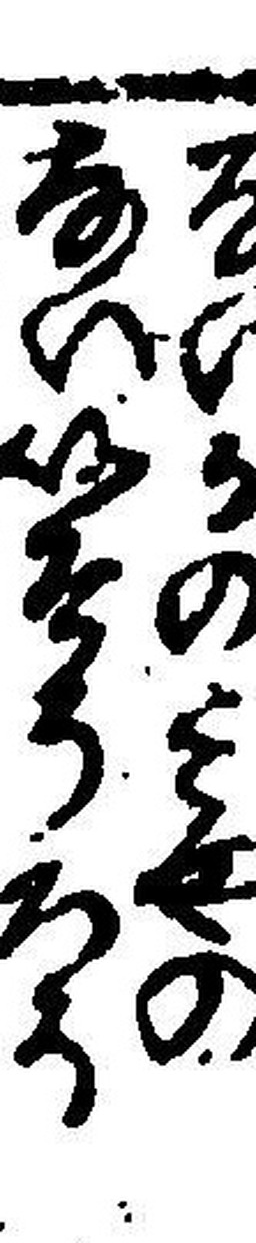ないいそうろう
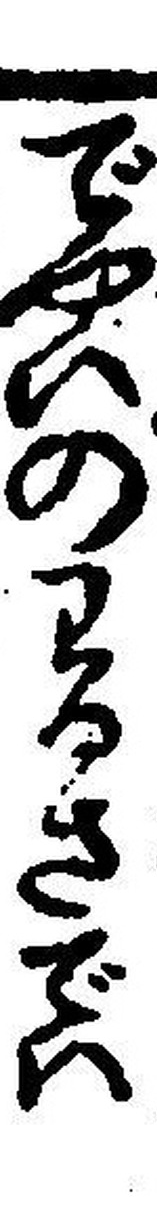でやいのわるさでは
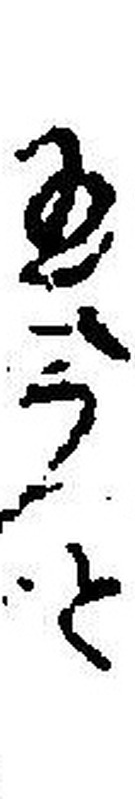玉さんと
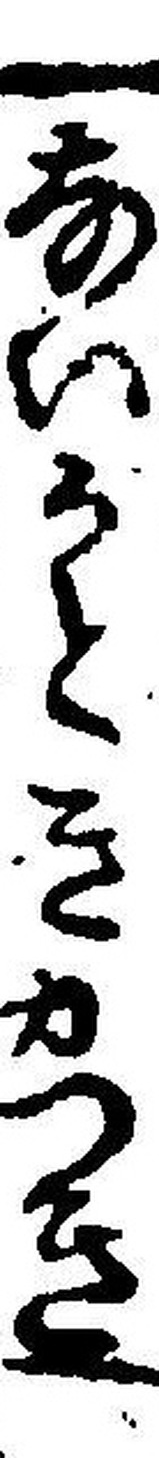ないかときかつき
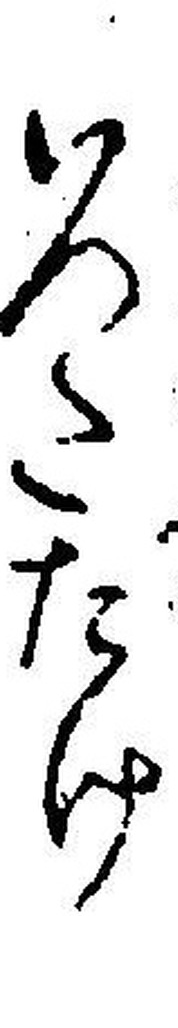いつただけ
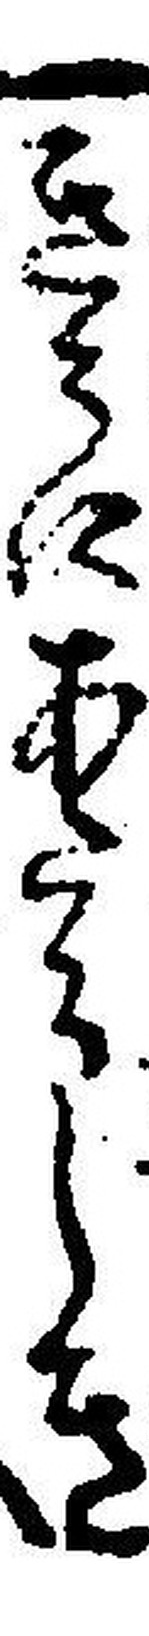きうにあたらしき
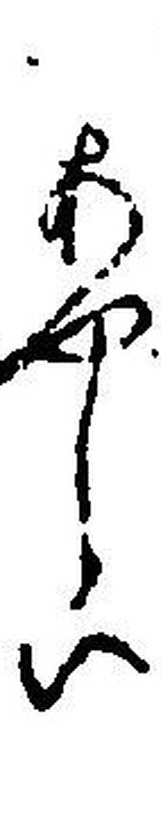あやしい
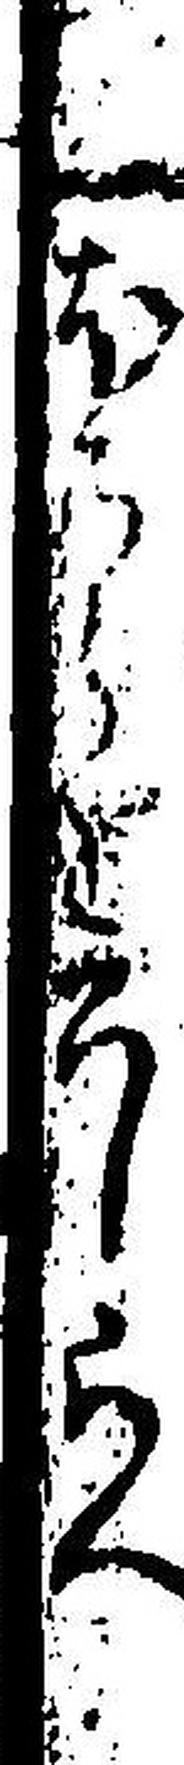ほこらをこしらへ
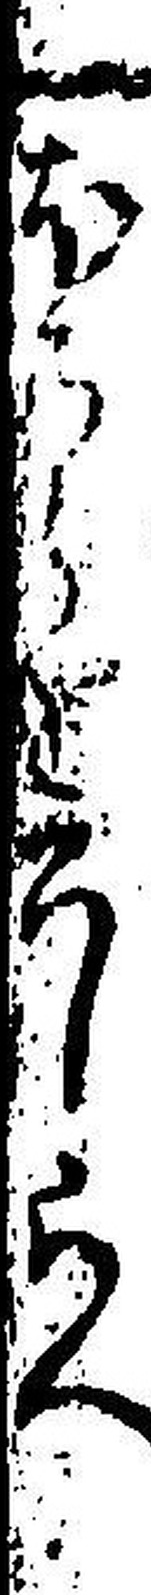ほこらをこしらへ
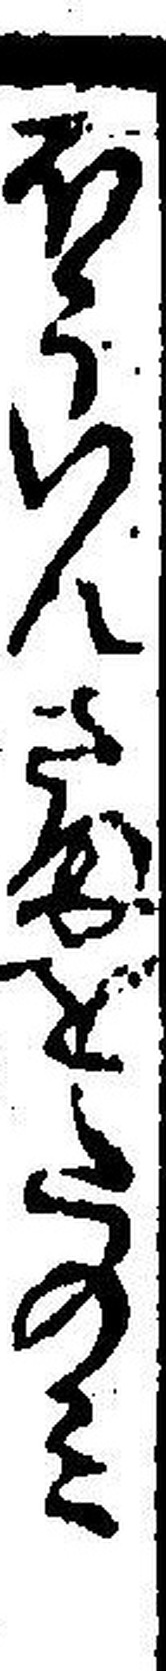ほういんさまをたのみ
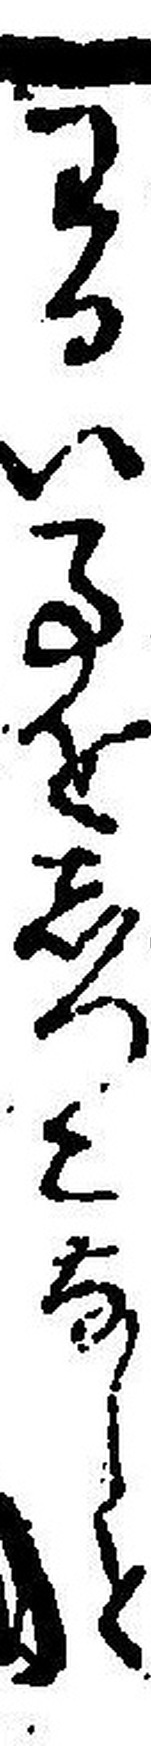わるい事をしつこなしと
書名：間違狐之女郎買 / 市場通笑作
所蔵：東京大学総合図書館 General Library in the University of Tokyo, JAPAN
